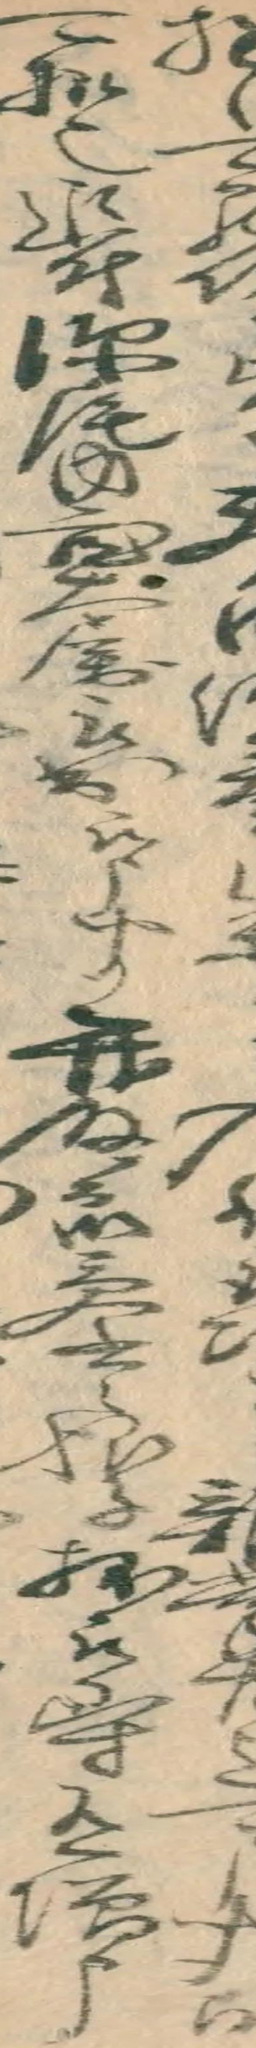可扣也追付深尾内蔵大属被出被申聞弁殿ニ而御受書之様子抔被尋有増申
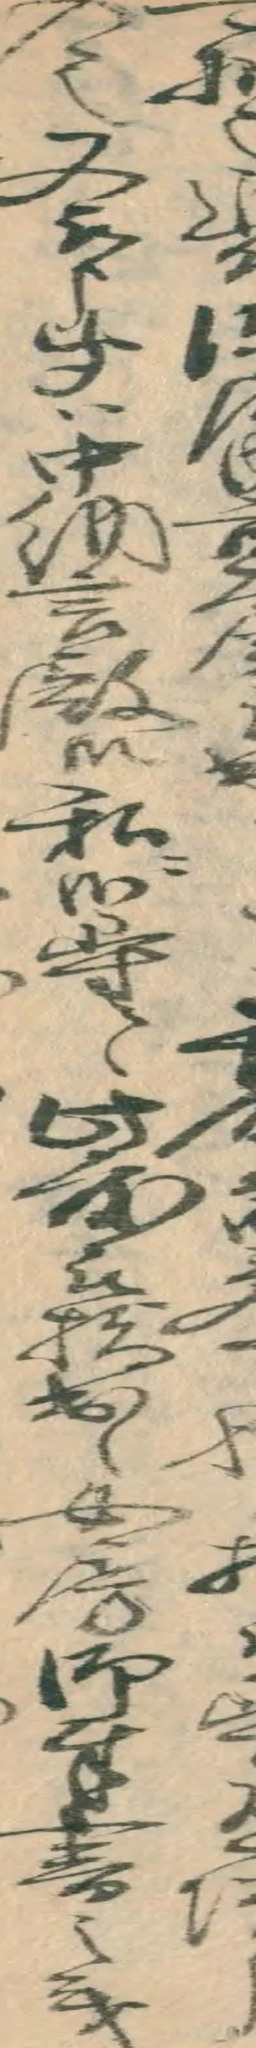入候也又被申聞ハ中納言殿故私ニ御尋候此度被指出候女房御奉書之義
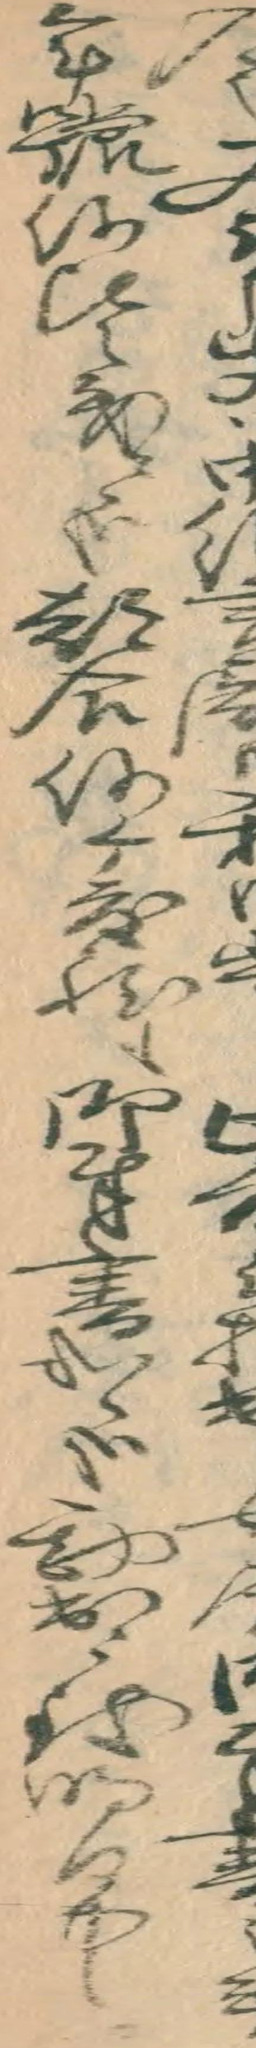年号何比之義ニ候哉都合何ヶ度程も御奉書出候哉勘出被致明日中

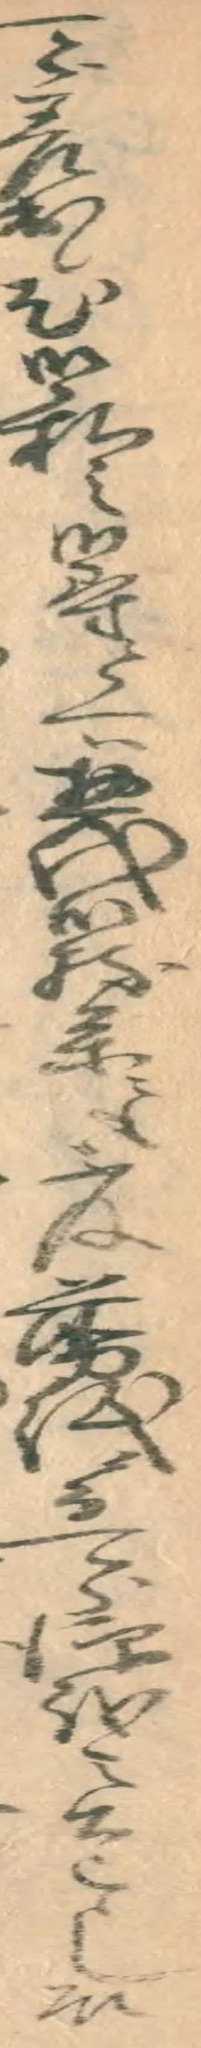可被差出候尤御私之御尋ニ候へハ惣代御持参ニも不及剪紙ニ而可被仰越之旨被申候故
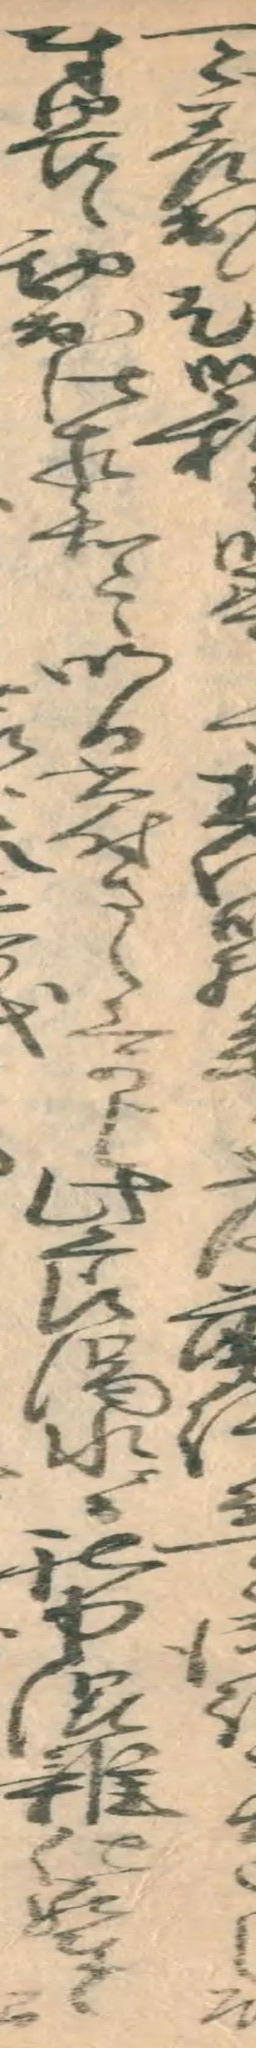奉畏候勘出仕相知候ハヽ明日書付さし上可申候此節渇水ニ而社中混雑仕罷在候間
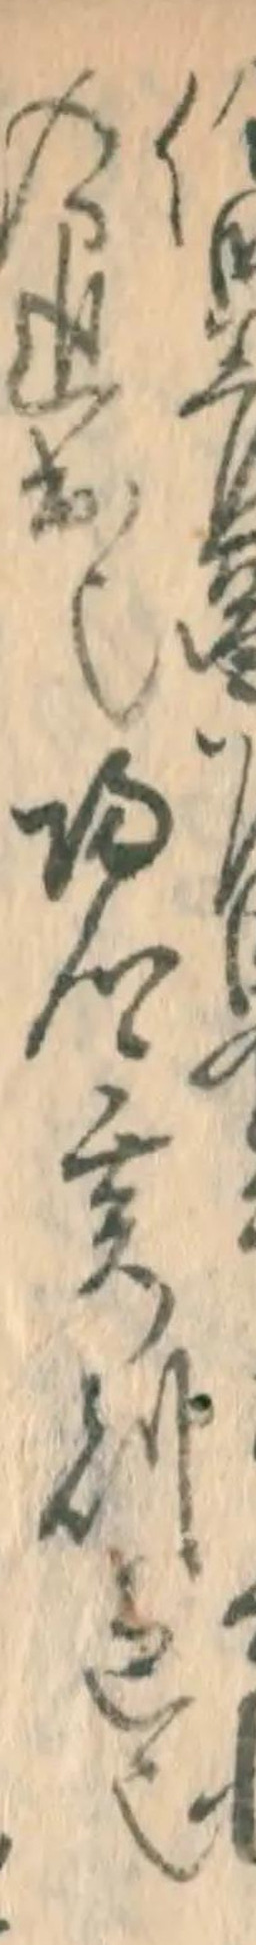入退出也帰郷亥ノ刻過也
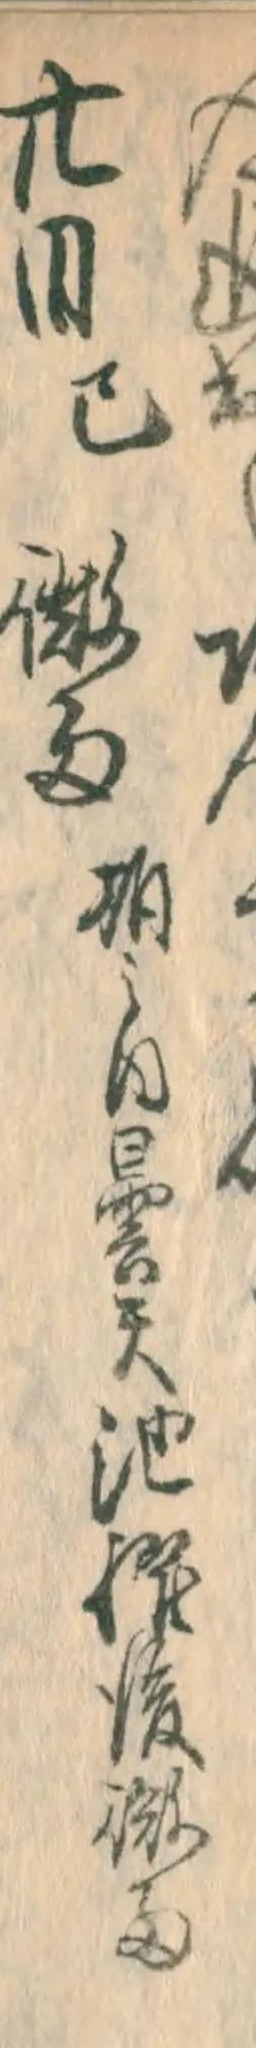廿日巳微雨朝之内曇天池擢後微雨
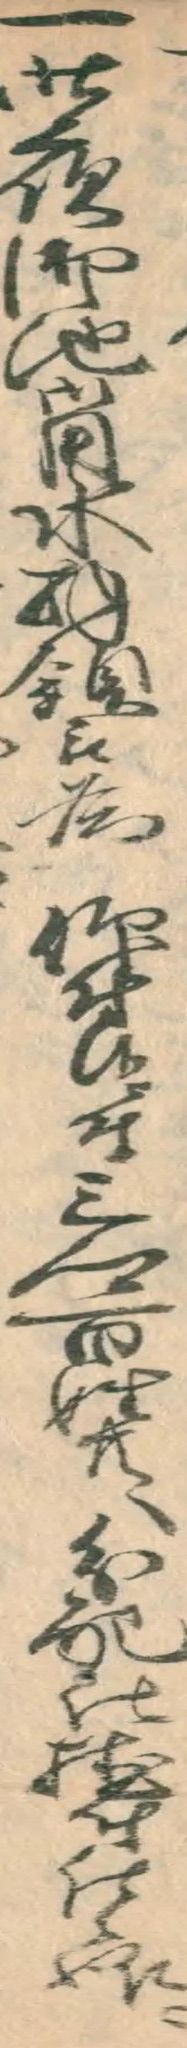一昨夜御池御用水拝領被為仰付候ニ付三郷百姓共へ分配仕植付仕候様ニ
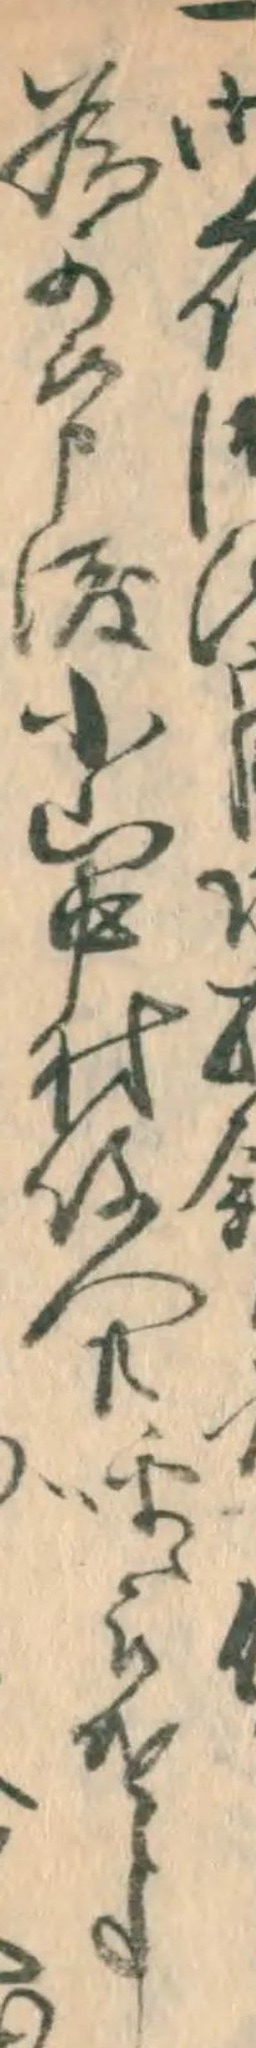為可被申渡小山中村役人共呼ニ被遣候事
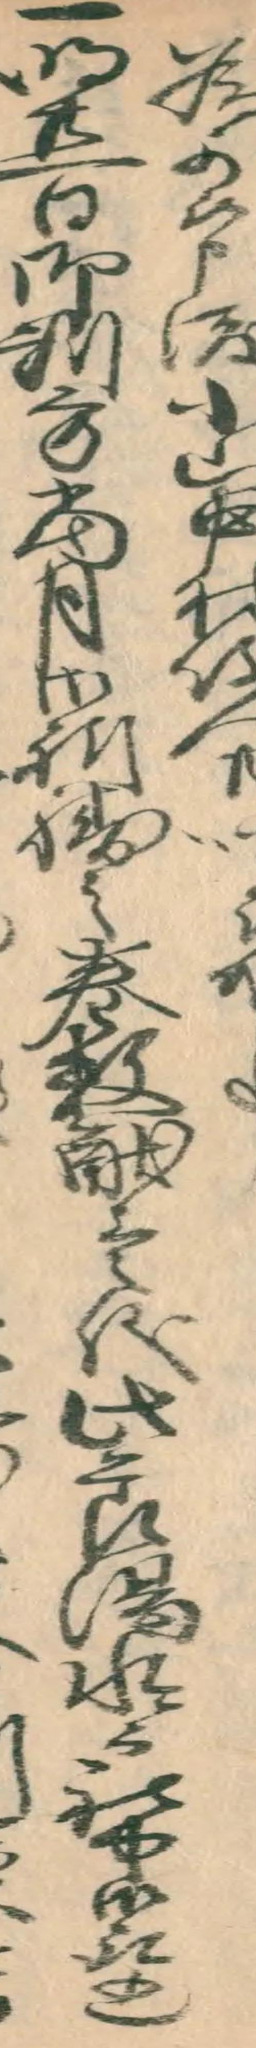一明廿一日御所方当月御祈祷之巻数献上之儀此節渇水ニ而社中御取込
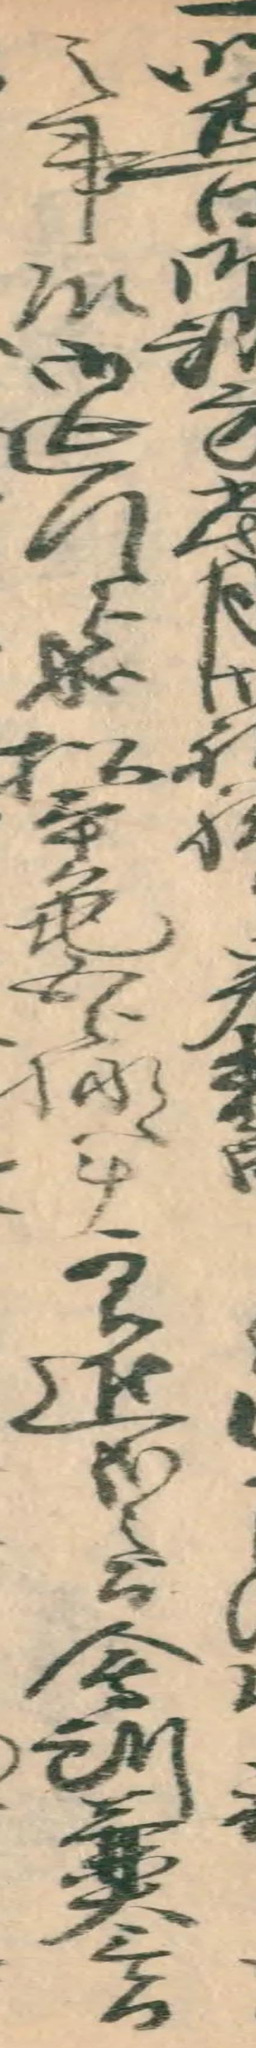之事故御延引被成松平亀五郎様へ計可被進哉之旨会所兼太今日
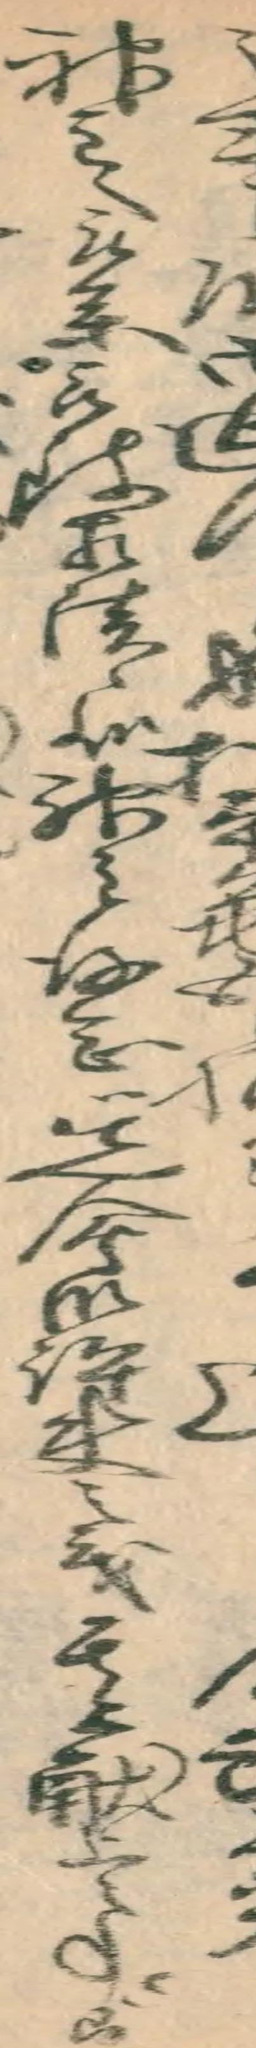神主へ被参被致相談候処神主存念ハ先会御評決之義其上献上之事ニ候間
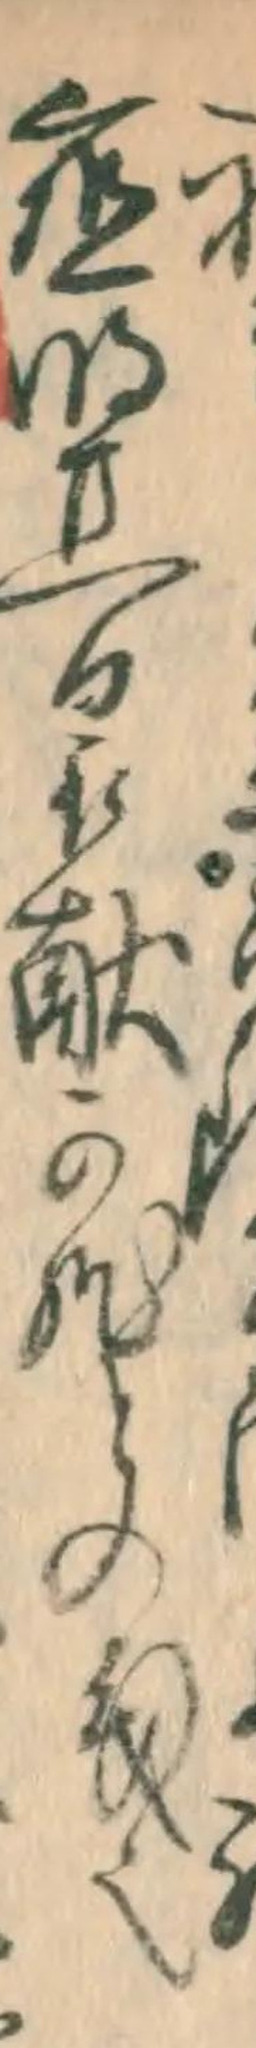愈明廿一日被献可然との義也
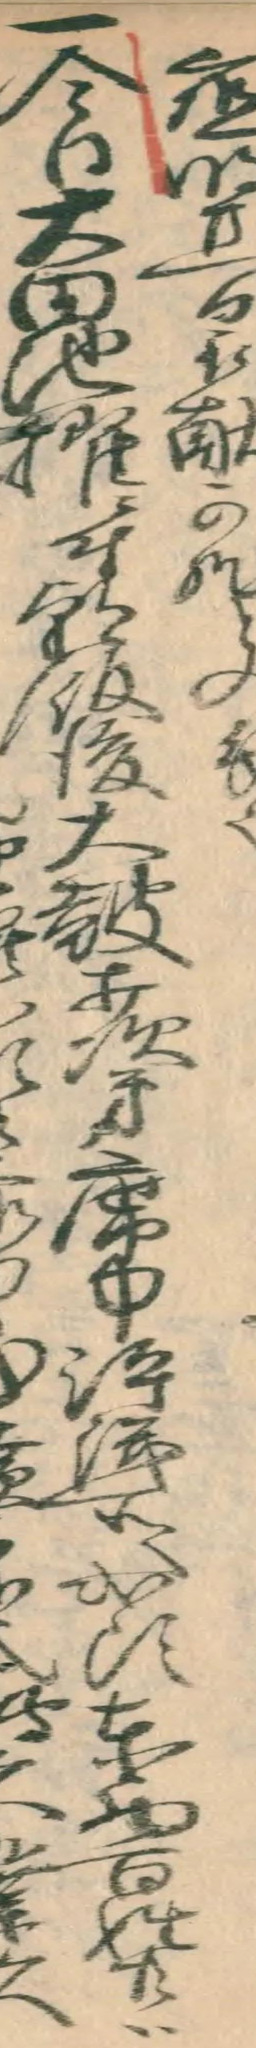一今日大田池擢ニ付朝飯後大鼓打次第席中評議所へ出頭東西百姓共ハ
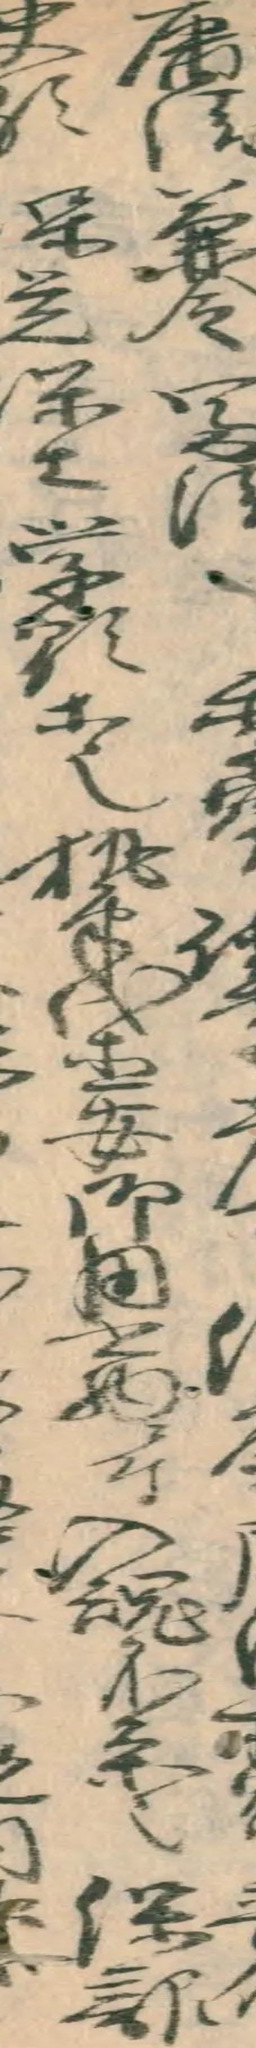史顕保覚保土学顕等也執筆代直安御用書物ニ付入魂不参也保韶
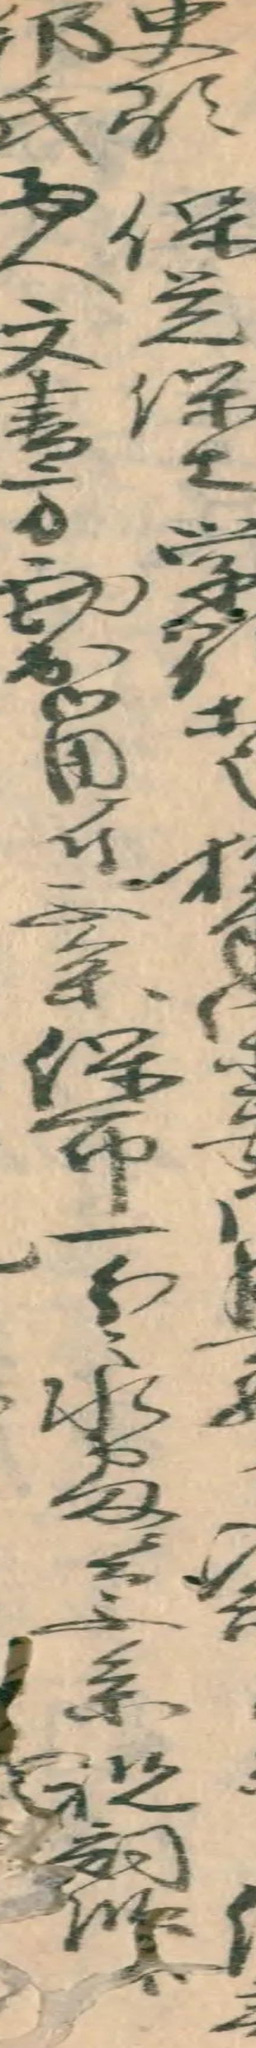邦氏両人文書方勘出御用ニ付不参保布一分之水番ニ而不参祝詞師
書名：賀茂社記録. 第58冊
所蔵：国立国会図書館 National Diet Library, JAPAN
